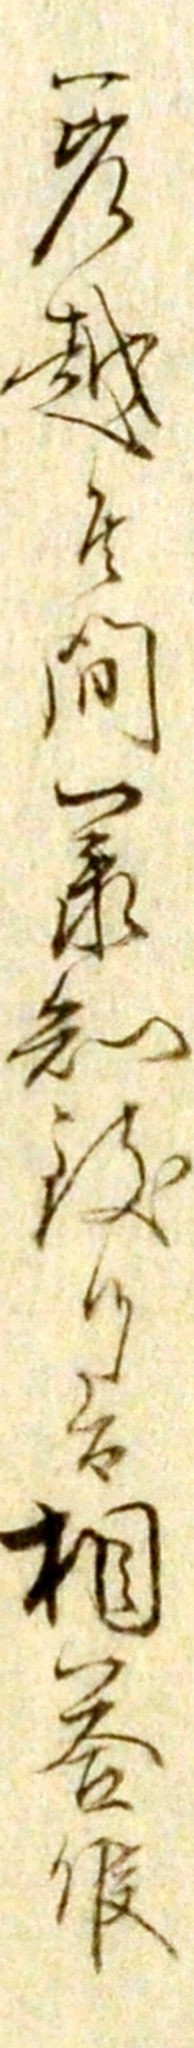差越候間承知致候旨相答候
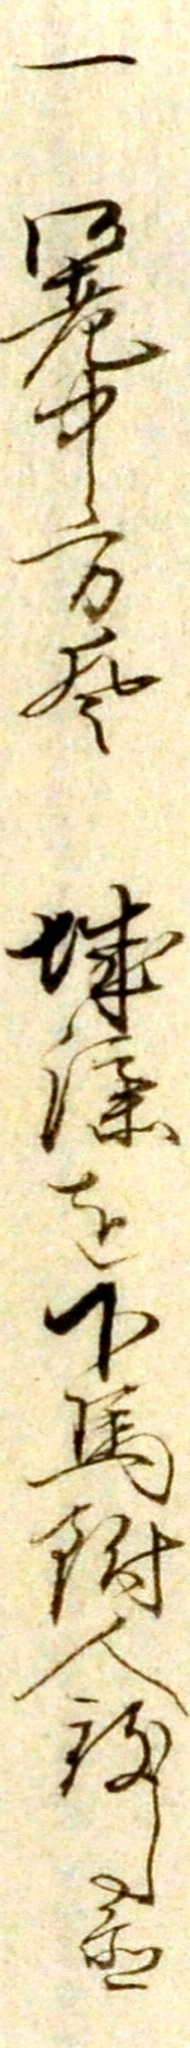一御老中方登城済を下馬附人致し置
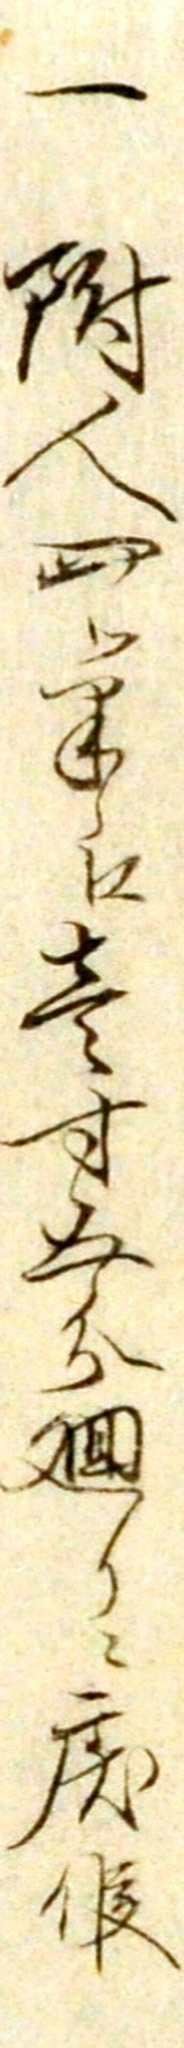一附人四ツ半え壱寸五分廻りニ戻候
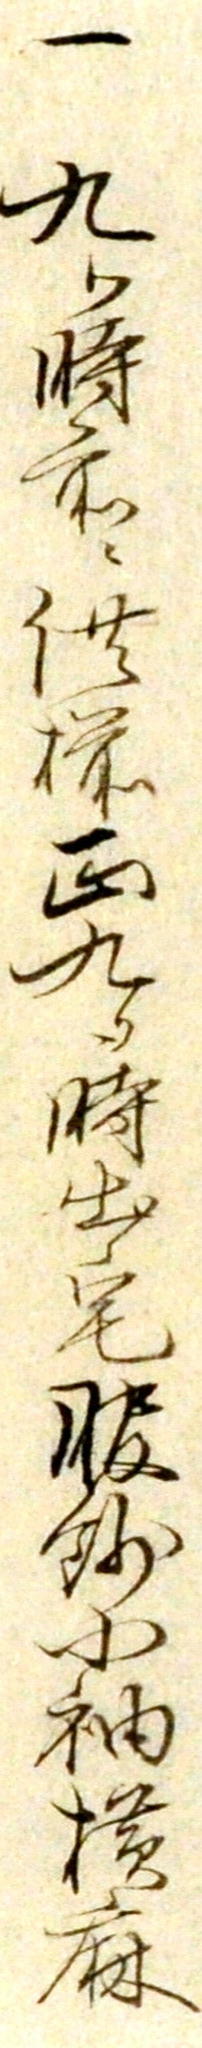一九ツ時前ニ供揃正九ツ時出宅服紗小袖横麻
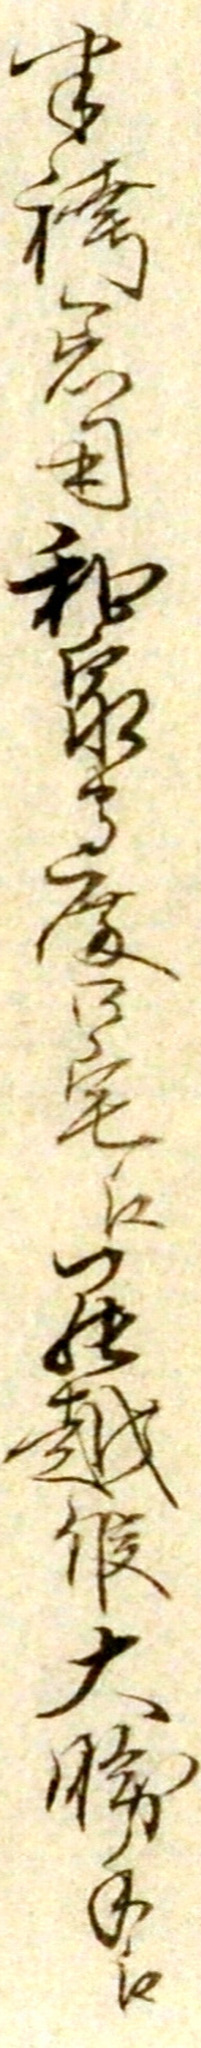半袴着用和泉守殿御宅え罷越候大勝手え
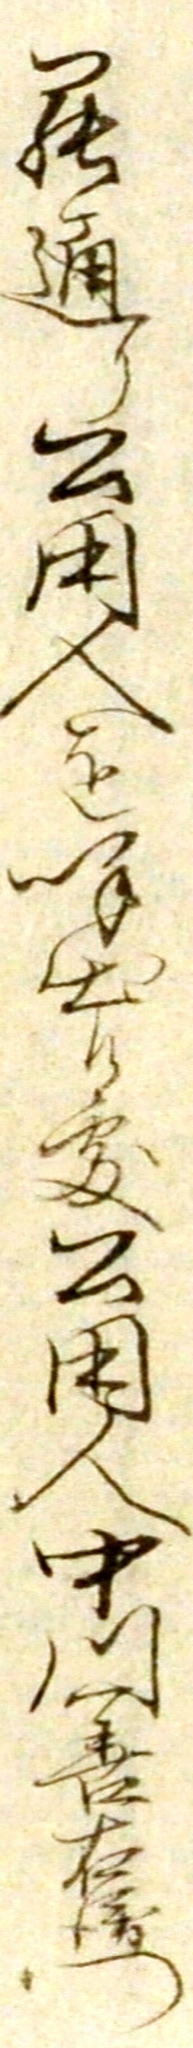罷通り公用人を呼出候處公用人中川善右衛門

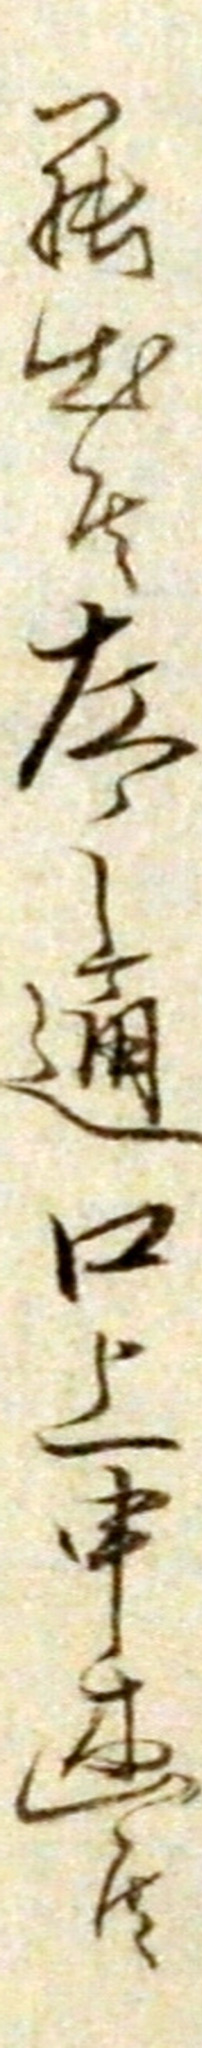罷出候左之通口上申述候
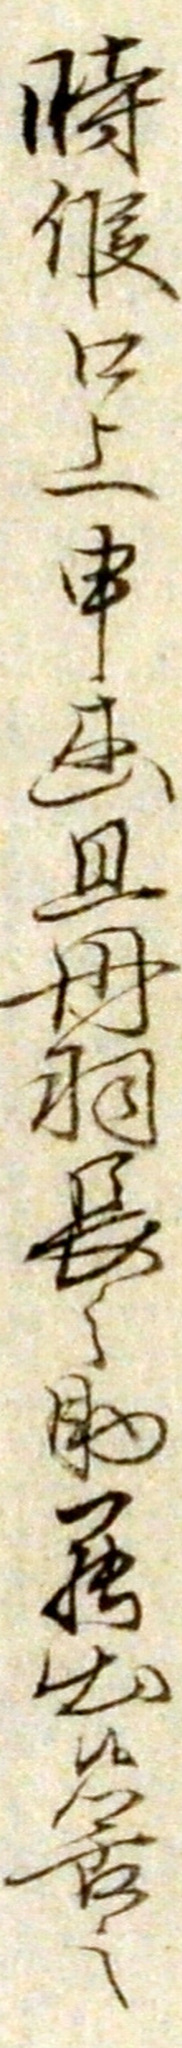時候口上申述且丹羽長之助罷出候筈之
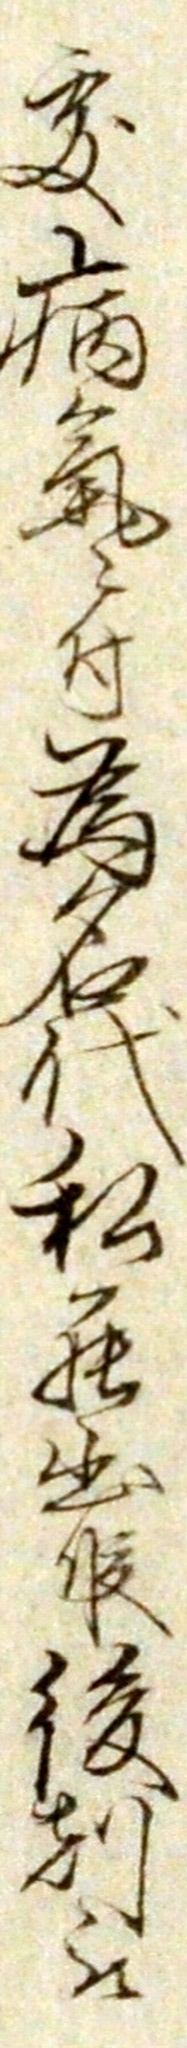處病気ニ付為名代私罷出候後刻被
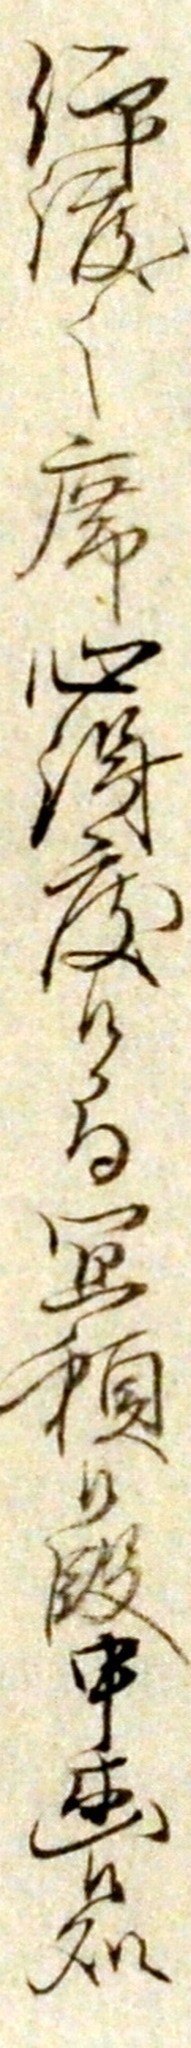仰渡之席心得度候間宜頼候段申述候処
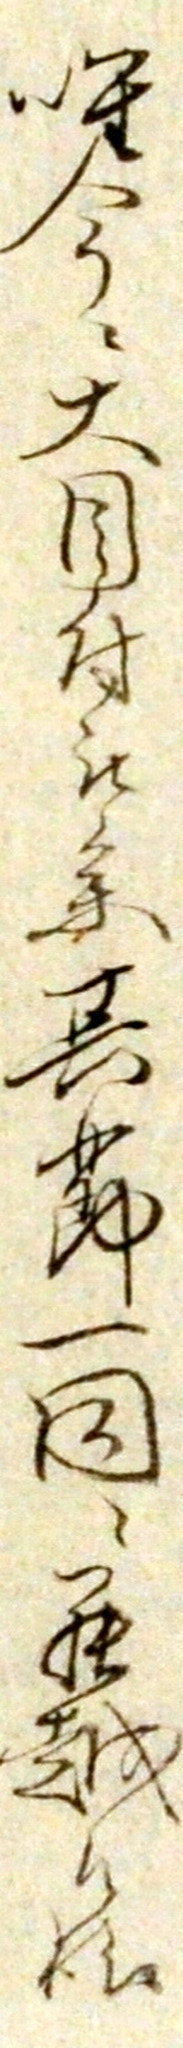唯今ニ大目付被参其節一同ニ罷越候様
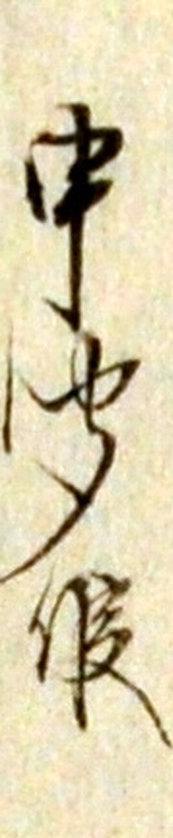申聞候
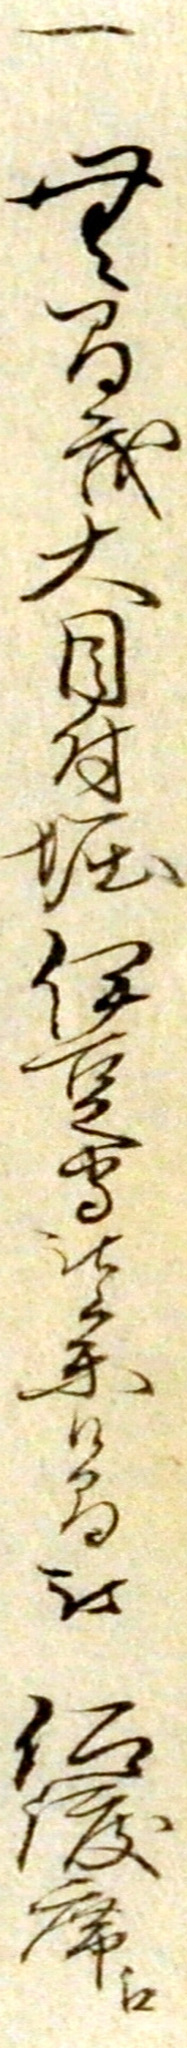一無間も大目付堀伊豆守被参候間被仰渡席え
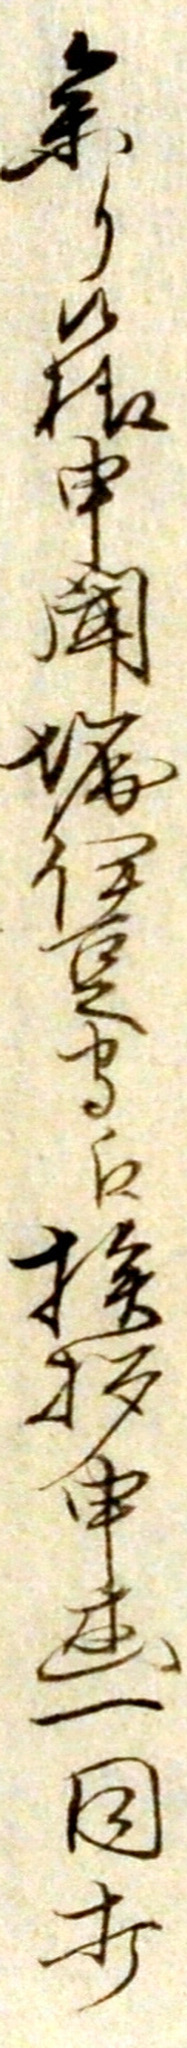参り候様申聞堀伊豆守え挨拶申述一同打
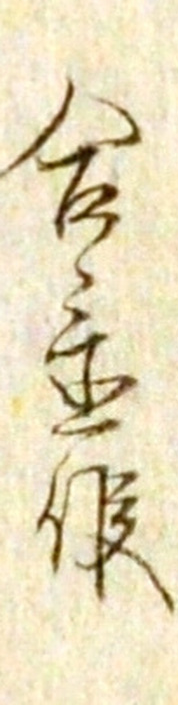合置候
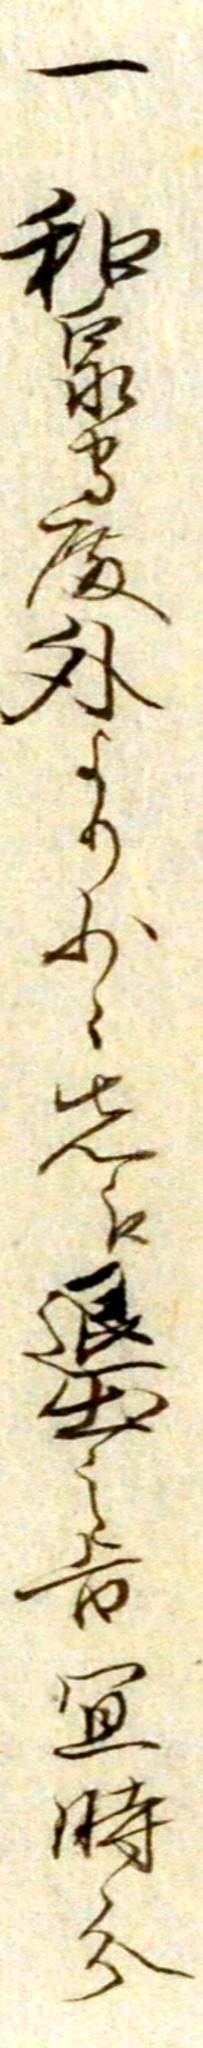一和泉守殿外より少々先え退出之旨宜時分
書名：諸名代相勤候節ノ留書外
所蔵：伊那市立高遠町図書館・合同会社AMANE
